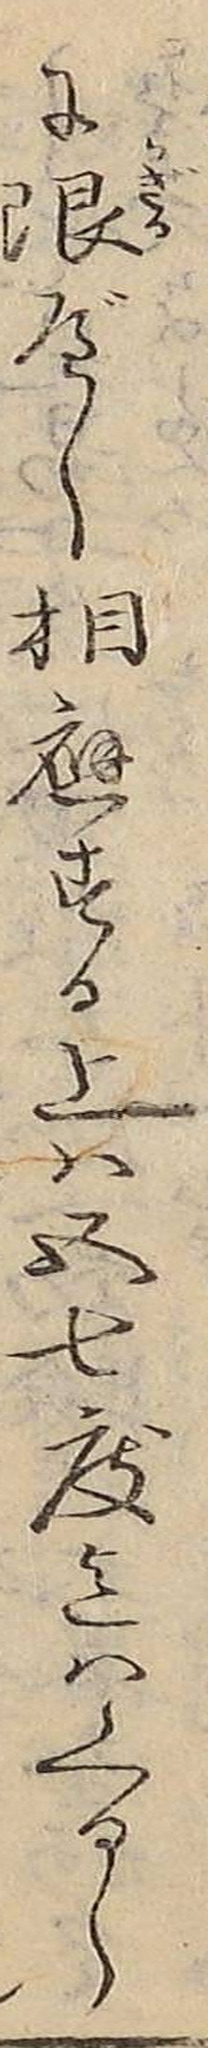に限べし相応する上は五七度迄はくるし
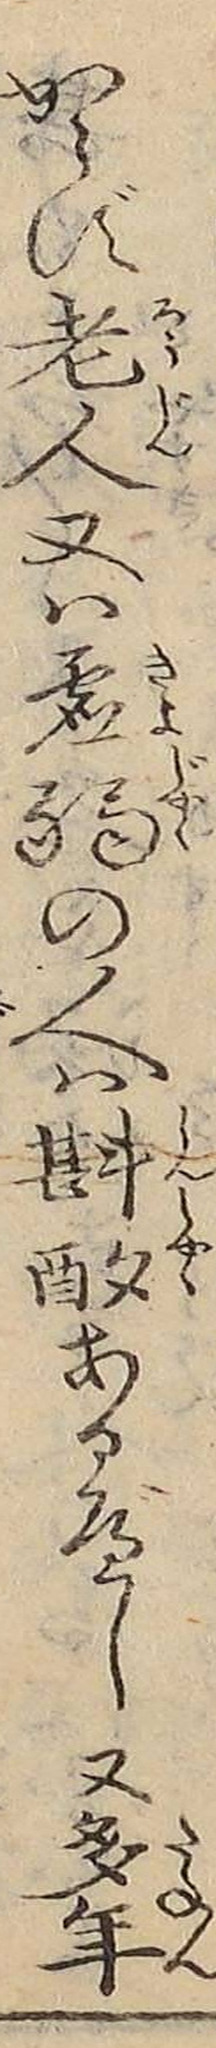からず老人又は虚弱の人は斟酌あるべし又多年
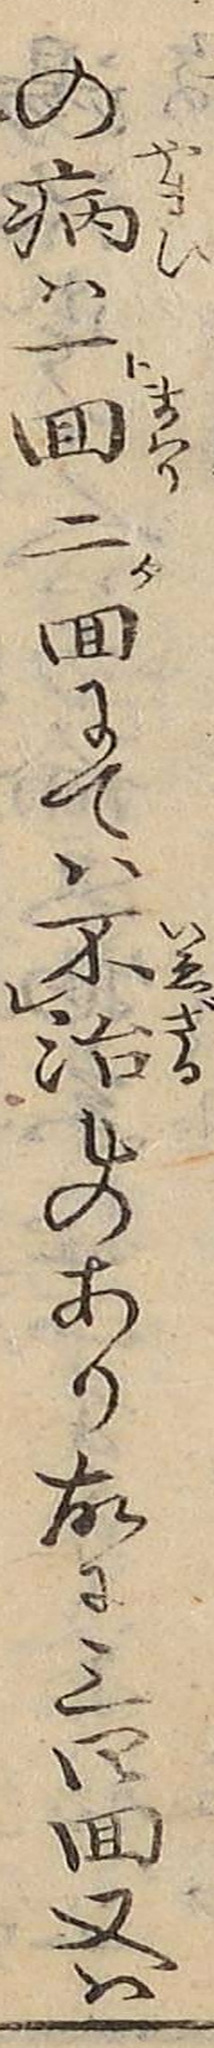の病は一回二回にては不治ものあり故に三四回又は
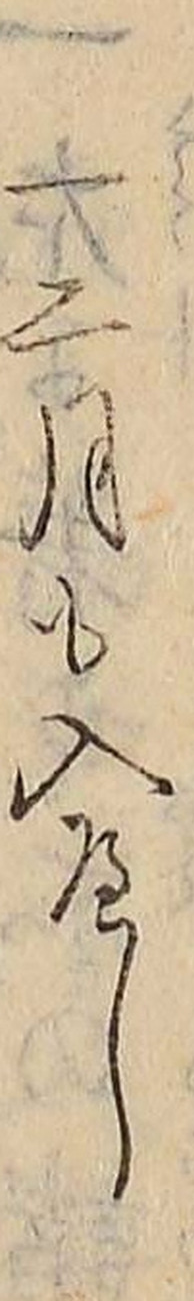一二月も入へし
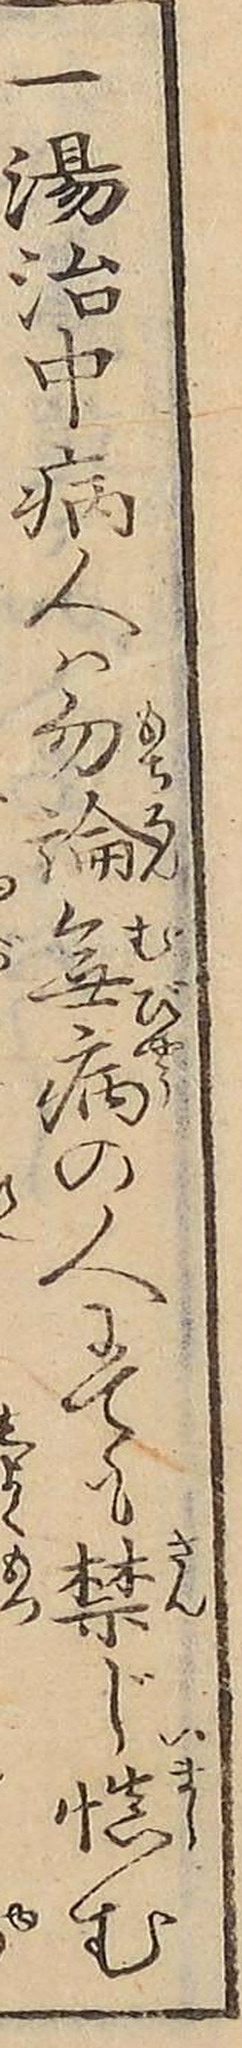一湯治中病人は勿論無病の人にても禁じ慎む
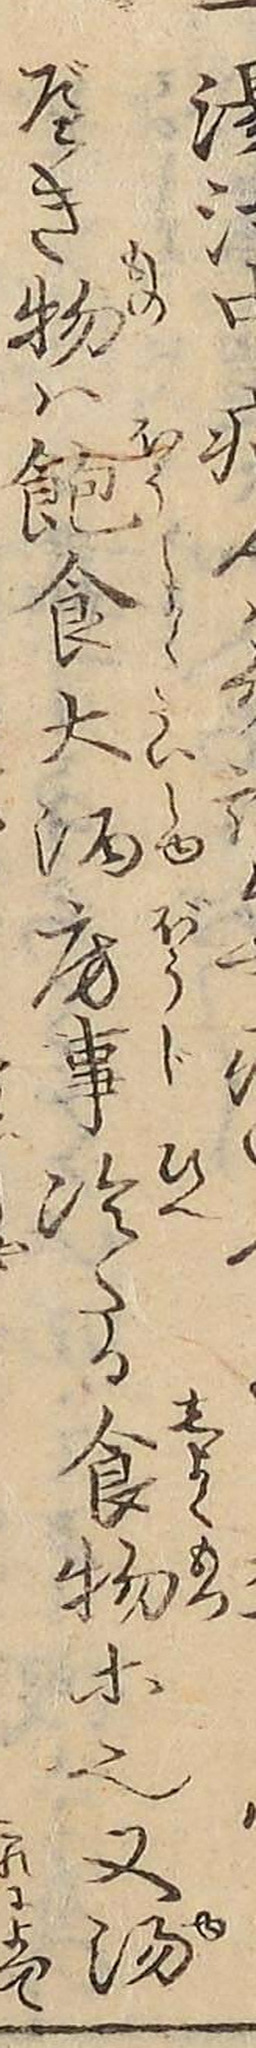べき物は飽食大酒房事冷たる食物等也又湯
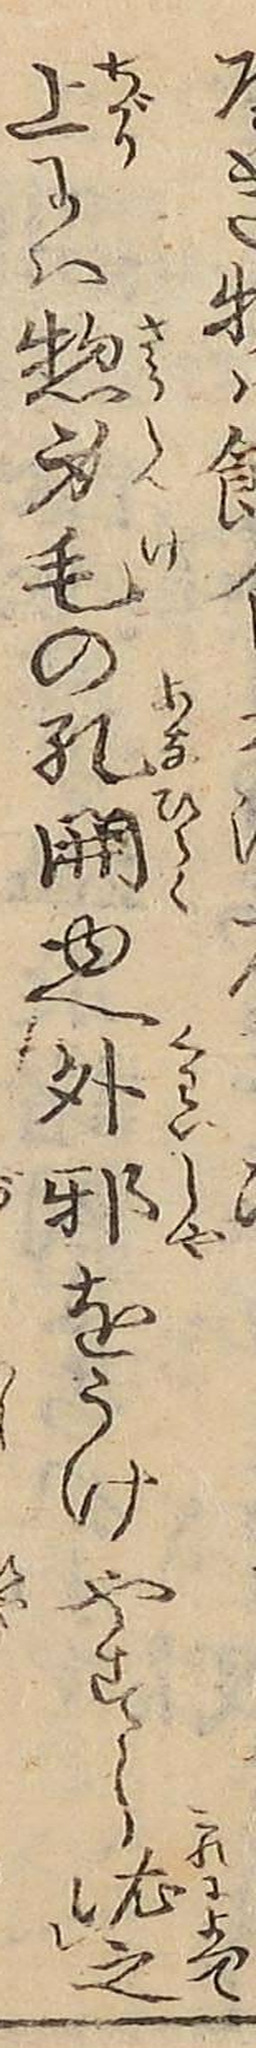上には惣身毛の孔開ゆへ外邪をうけやすし依之
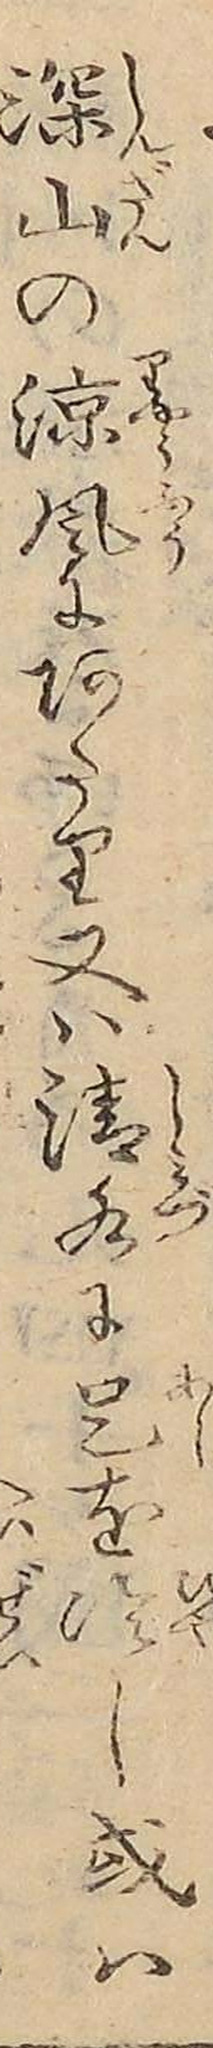深山の涼風にあたり又は清水に足を冷し或は
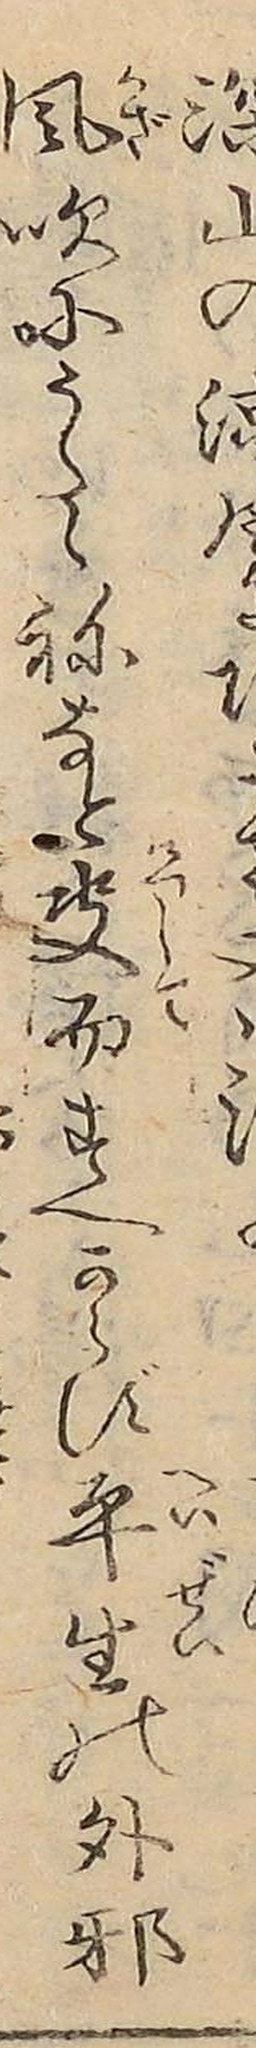風吹にうたゝねなと決而すへからず平生の外邪
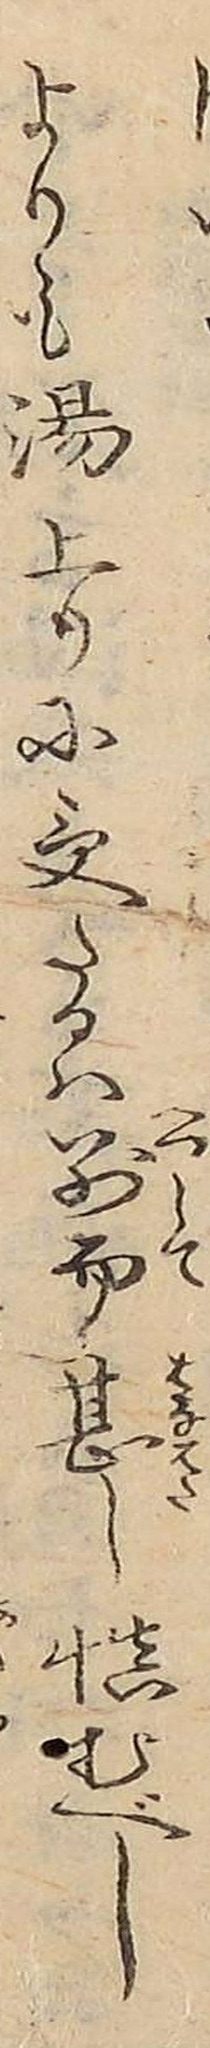よりも湯上りに受たるは別而甚し慎むべし
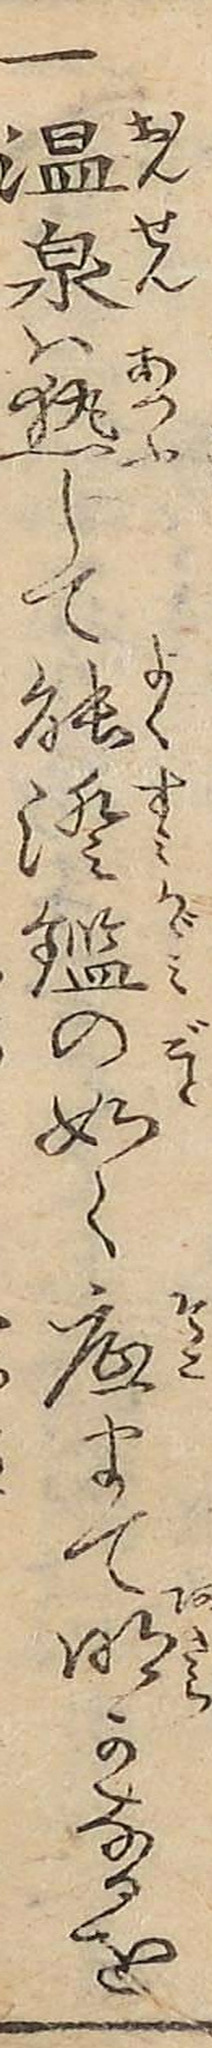一温泉は熱して能澄鑑の如く底まて明かなるを
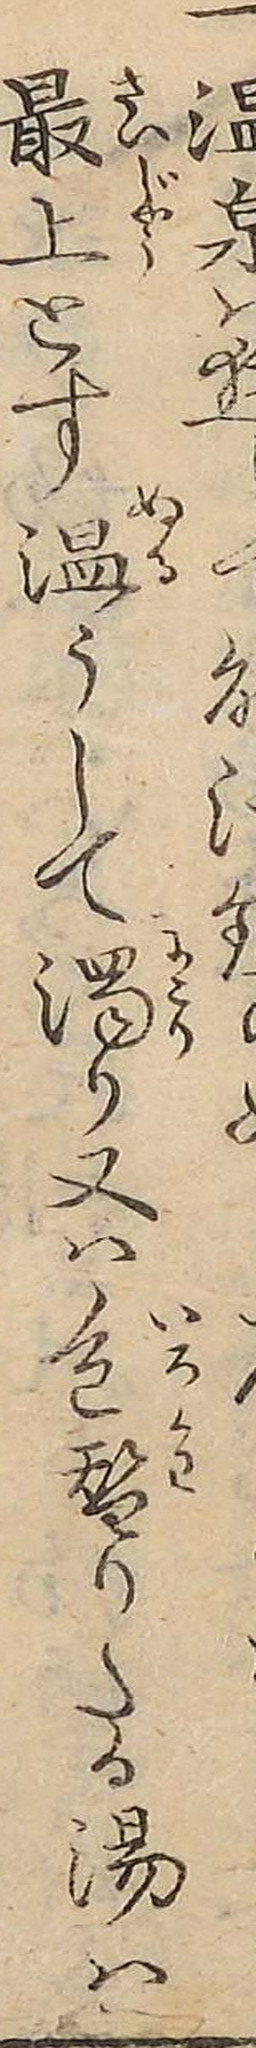最上とす温うして濁り又は色替りたる湯は
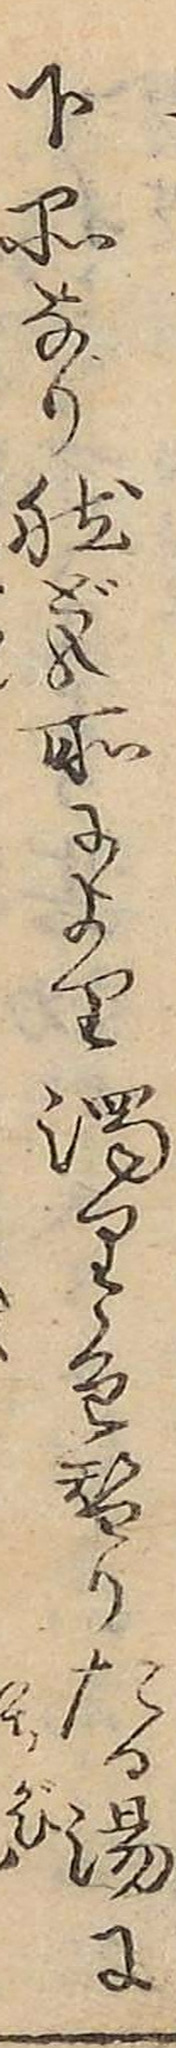下品なり然ども所により濁り色替りたる湯に
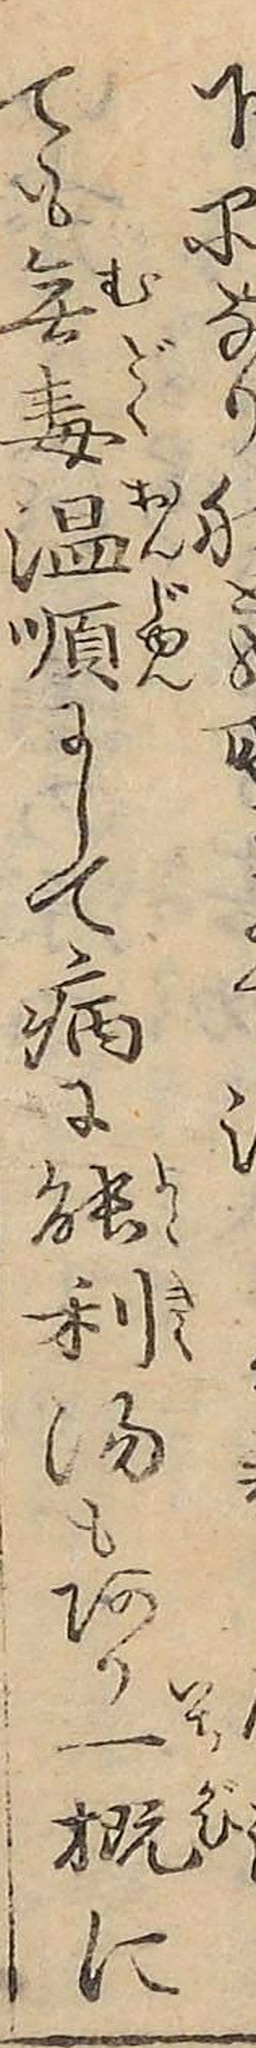ても無毒温順にして病に能利湯もあり一概に

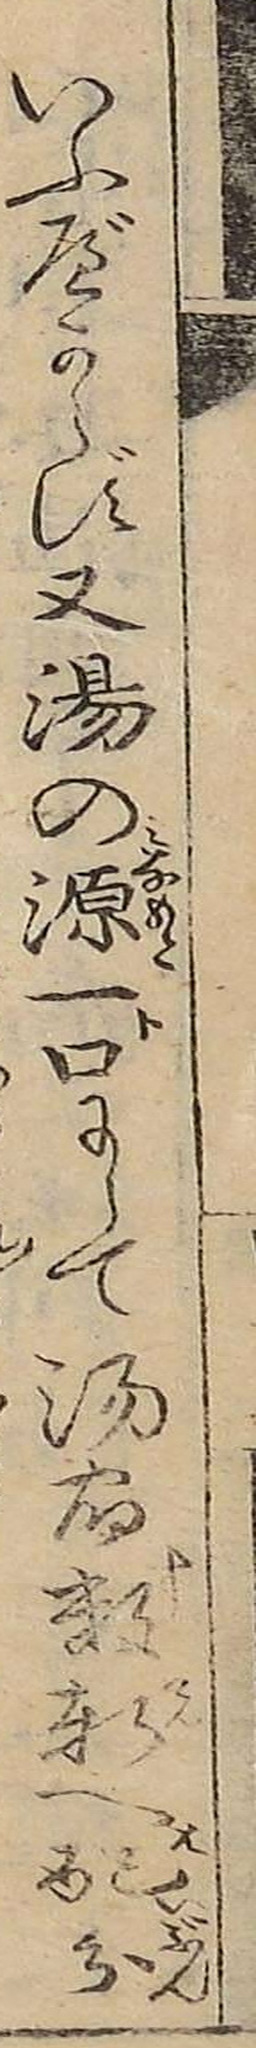いふべからず又湯の源一口にして湯宿数軒へ配分
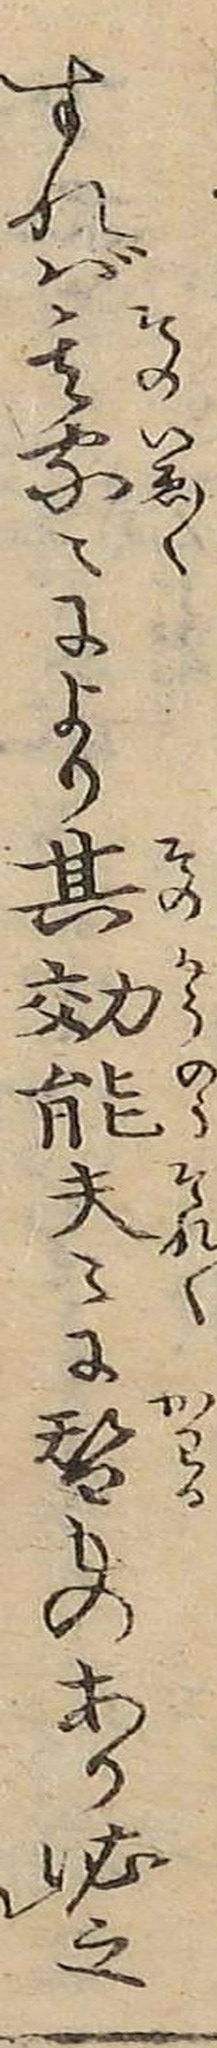すれば其家々により其効能夫々に替ものあり依之
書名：旅行用心集
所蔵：神戸大学附属図書館 国文学研究資料館
